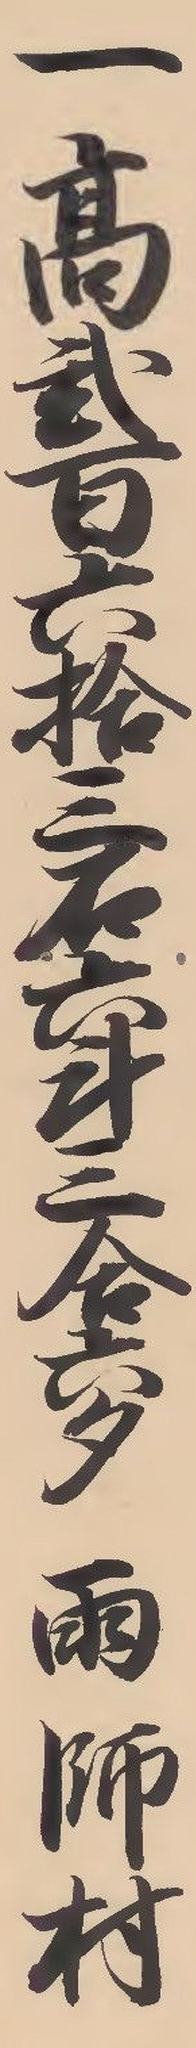一高弐百六拾三石六斗三合六勺雨師村

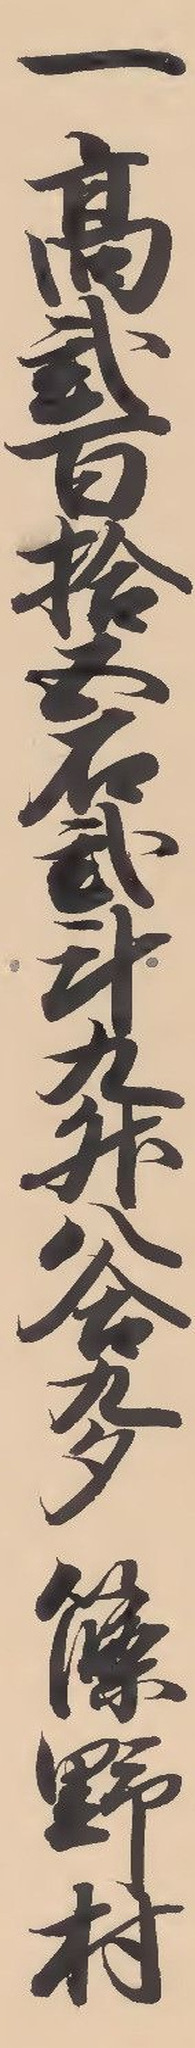一高弐百拾五石弐斗九升八合九勺篠野村
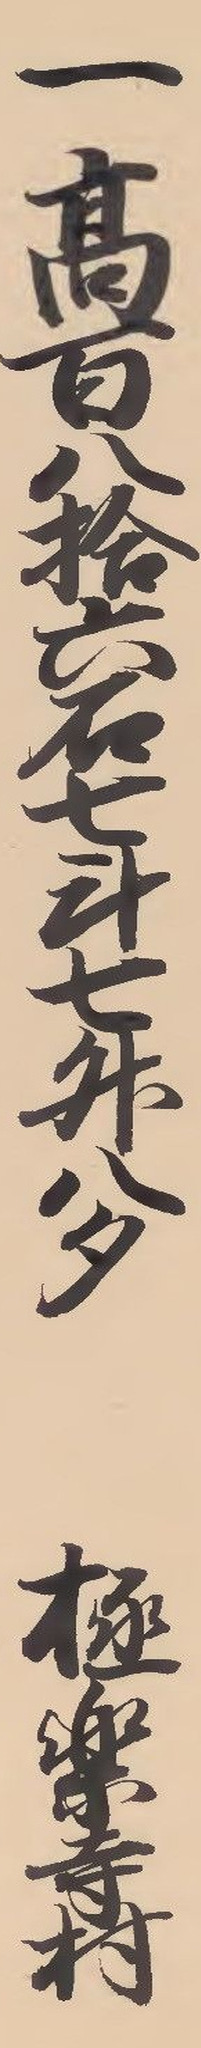一高百八拾六石七斗七升八勺極楽寺村
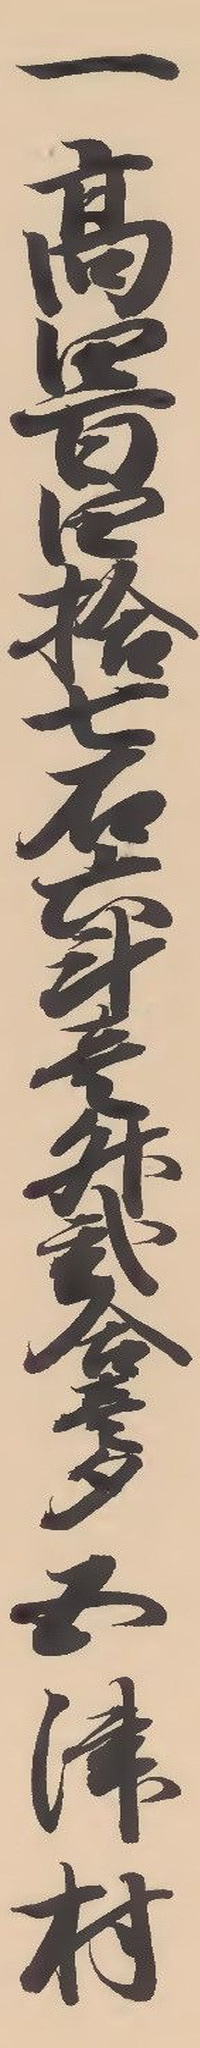一高四百四拾七石六斗壱升弐合壱勺五津村
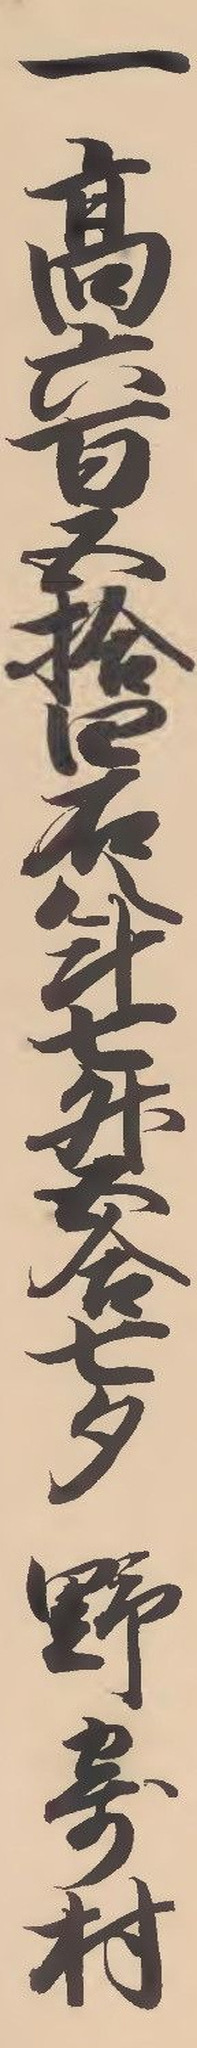一高六百五拾四石八斗七升五合七勺野寄村
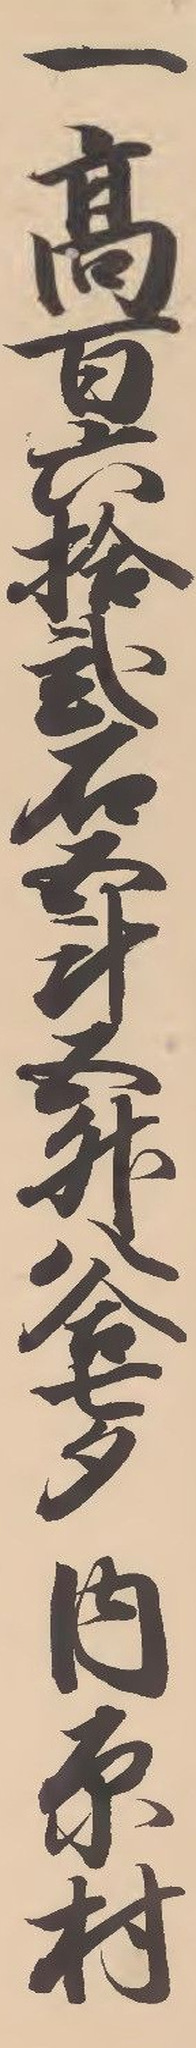一高百六拾弐石五斗五升八合七勺内原村
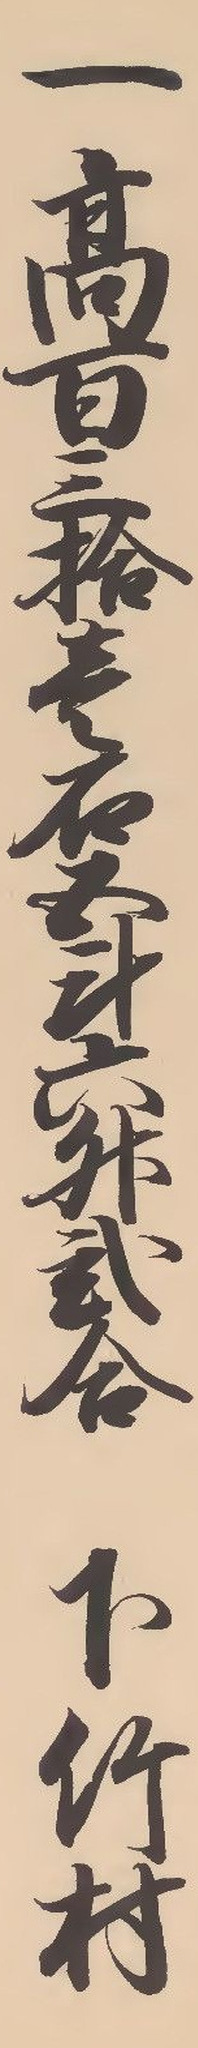一高百三拾壱石五斗六升弐合下竹村
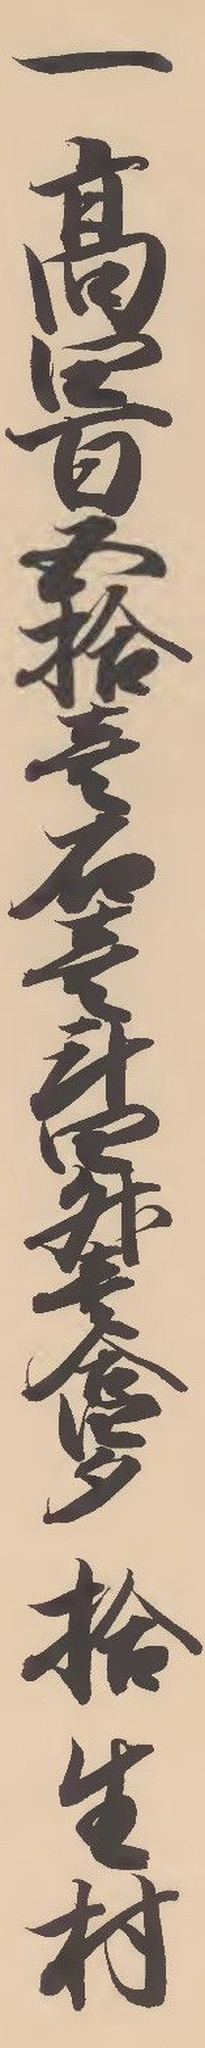一高四百五拾壱石壱斗四升壱合四勺拾生村
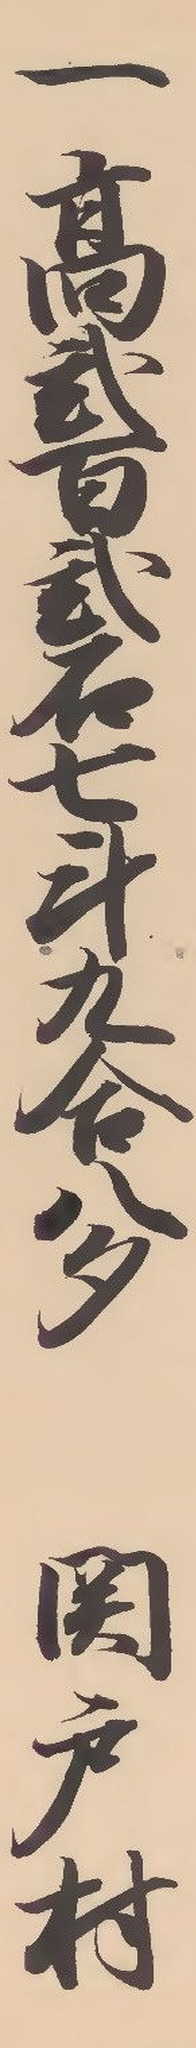一高弐百弐石七斗九合八勺関戸村

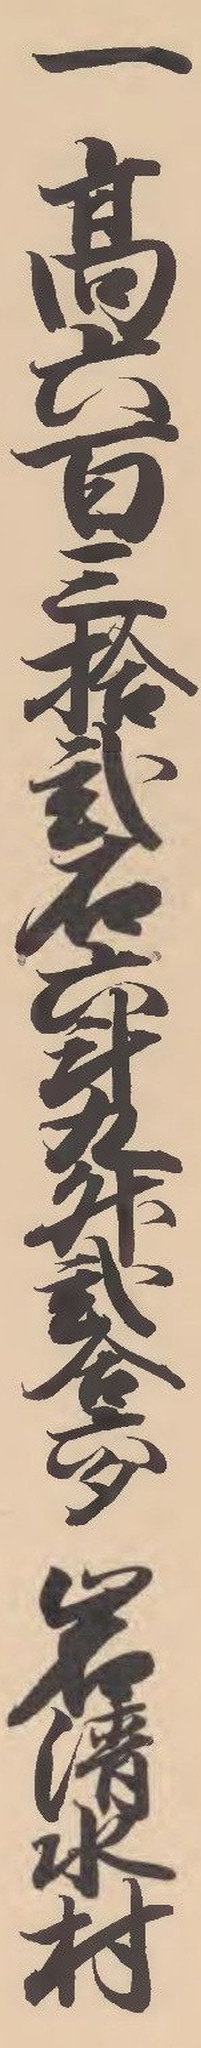一高六百三拾弐石六斗九升弐合六勺岩清水村
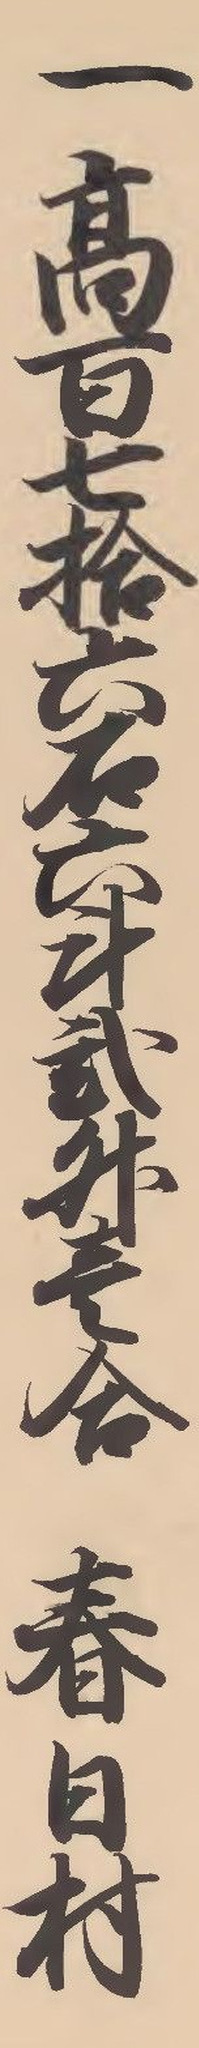一高百七拾六石六斗弐升壱合春日村
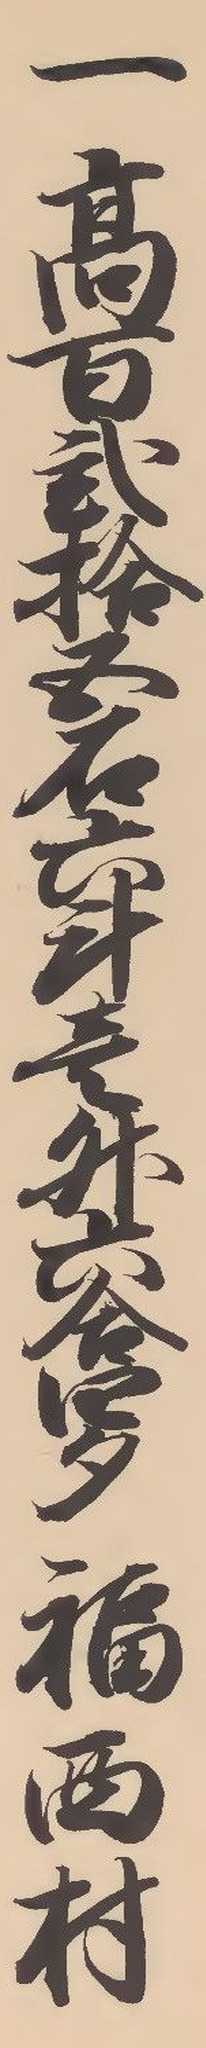一高百弐拾五石六斗壱升六合四勺福西村
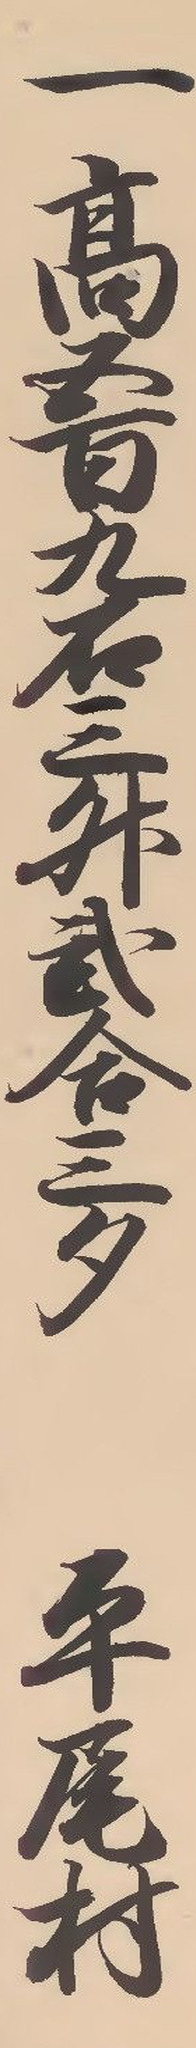一高五百九石三升弐合三勺平尾村
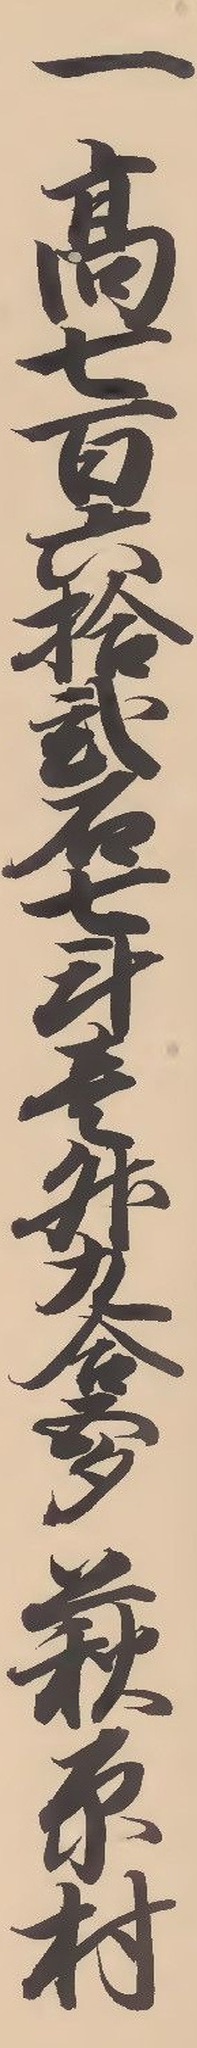一高七百六拾弐石七斗壱升九合五勺萩原村
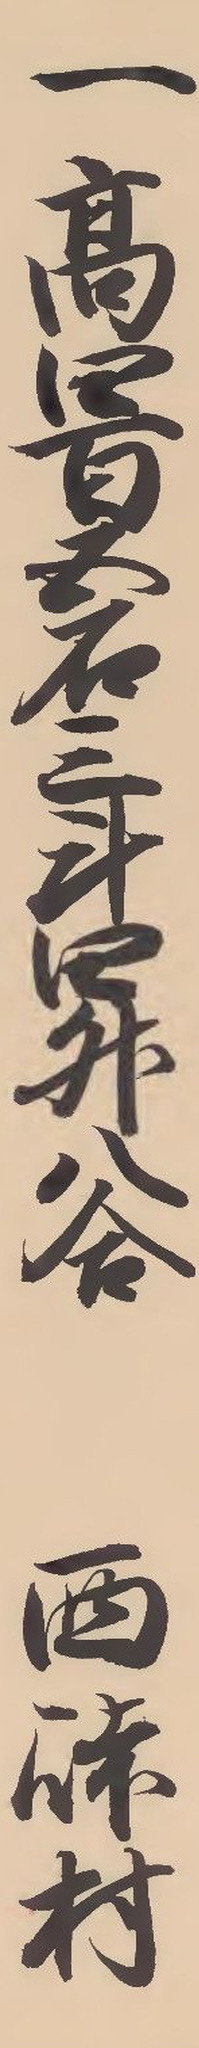一高四百五石三斗四升八合西峠村
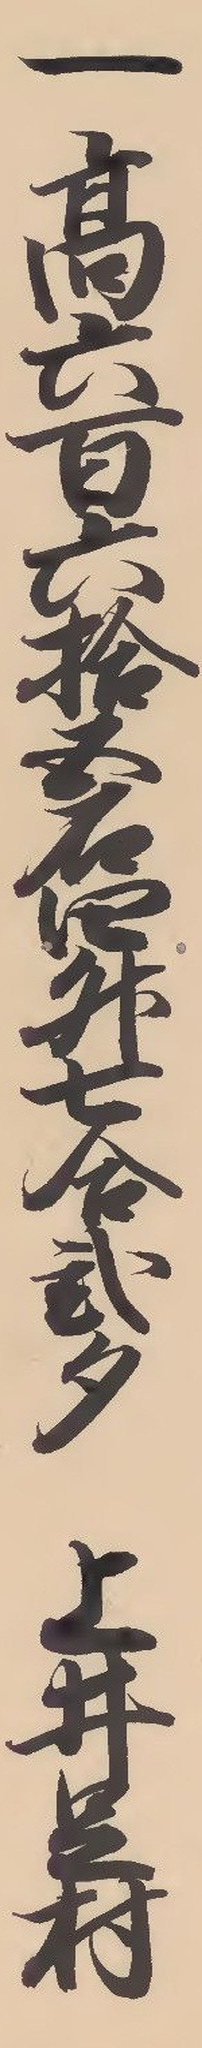一高六百六拾五石四升七合弐勺上井足村
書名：大和国郷帳
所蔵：国立公文書館 National Archives of Japan
